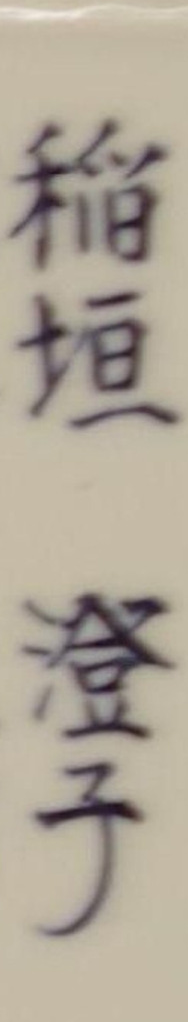稲垣澄子
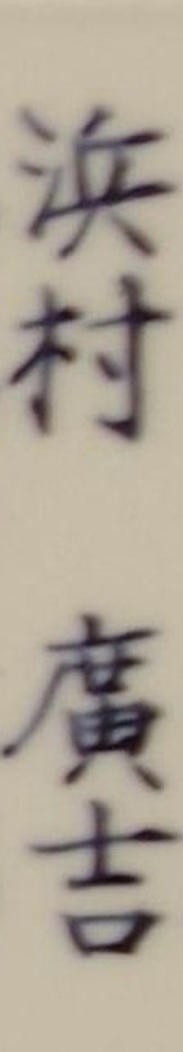近村広吉
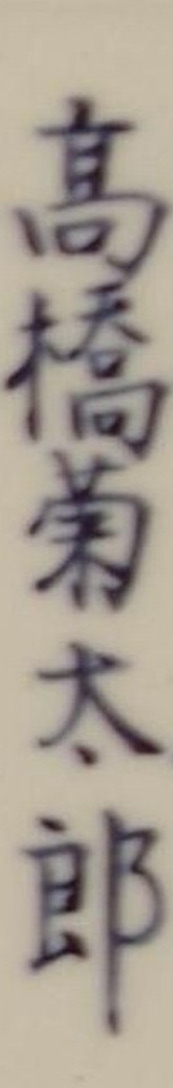高橋菊太郎
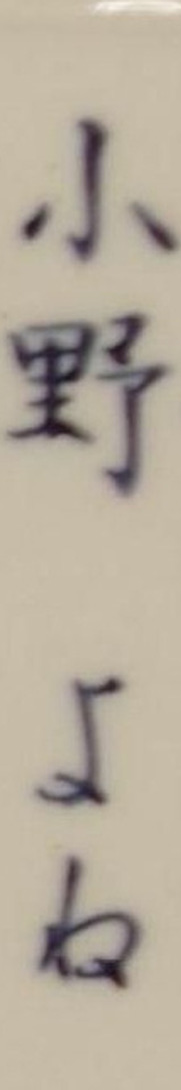小野よね
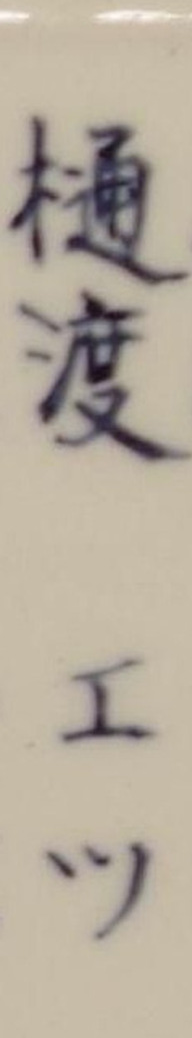樋渡エツ
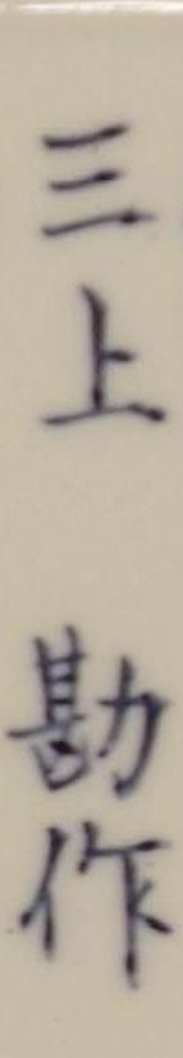三上勘作
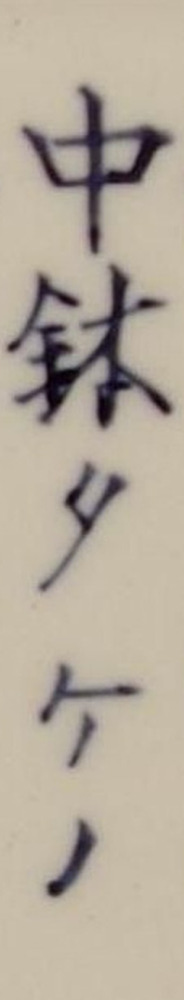中鉢タケノ
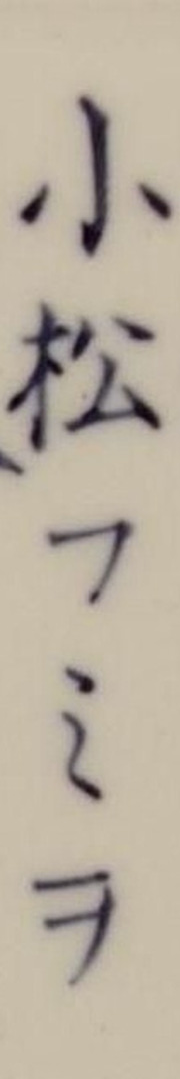小松フミヲ
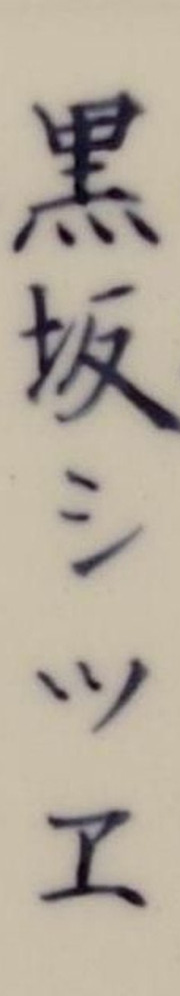黒坂シツヱ
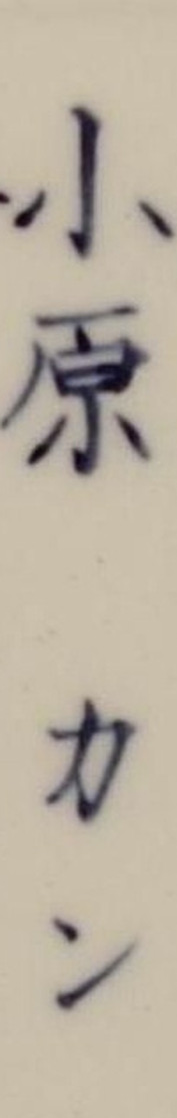小原カン
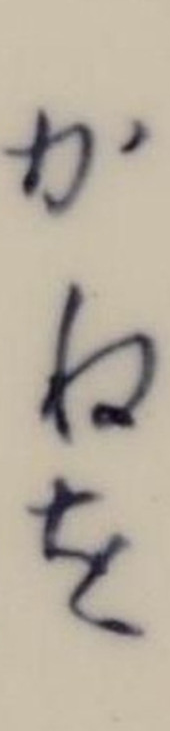かねを
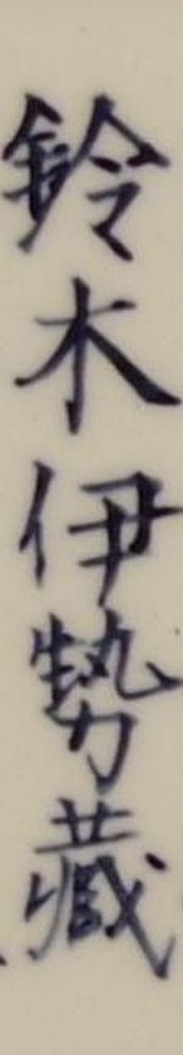鈴木伊勢蔵
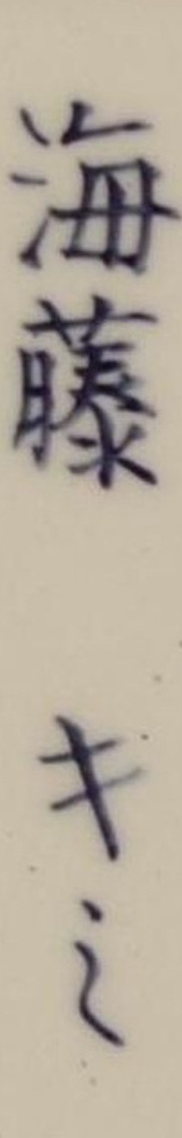海藤キミ
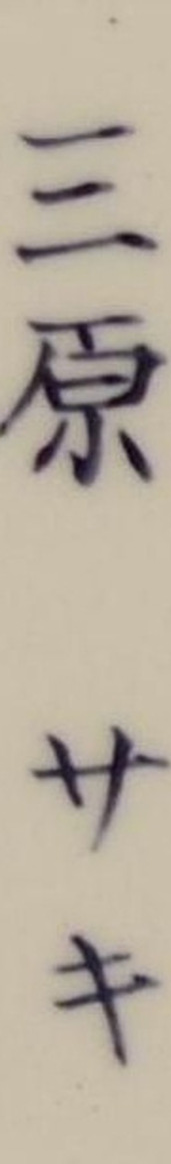三原サキ
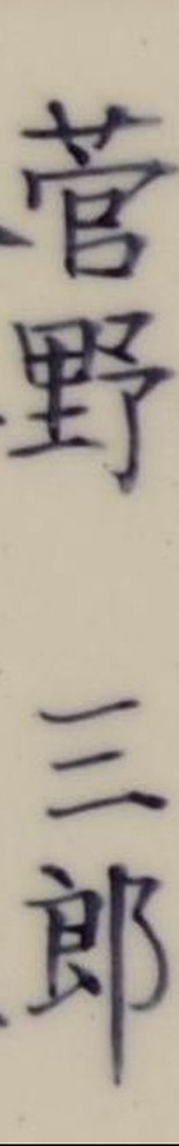菅野三郎
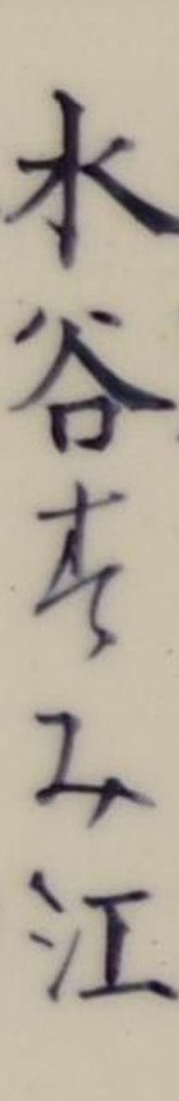水谷すみ江
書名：M~S
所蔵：高野山金剛峯寺
